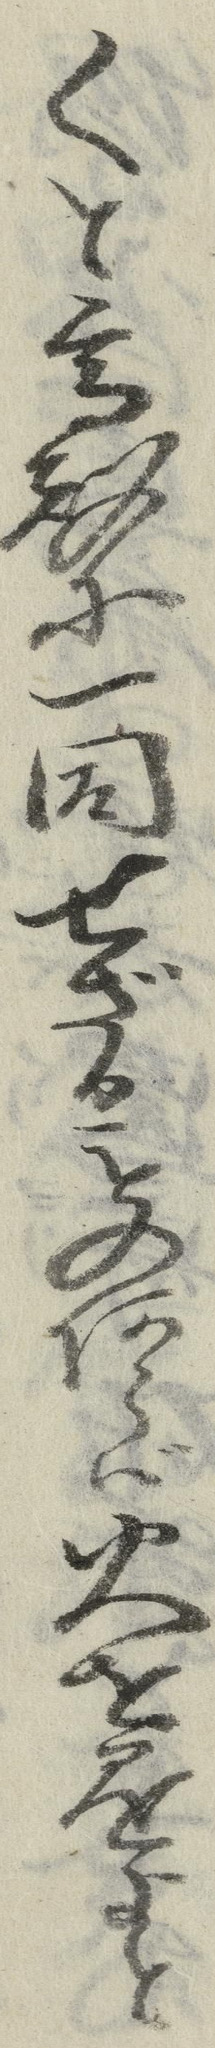〳〵と高勢に一同せざるものあらば火を懸よと
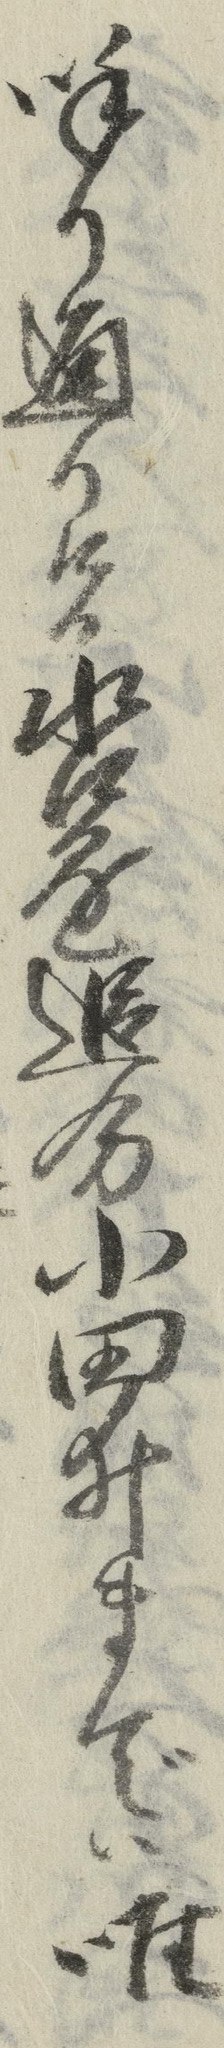呼り通りける沓懸追分小田井までは唯
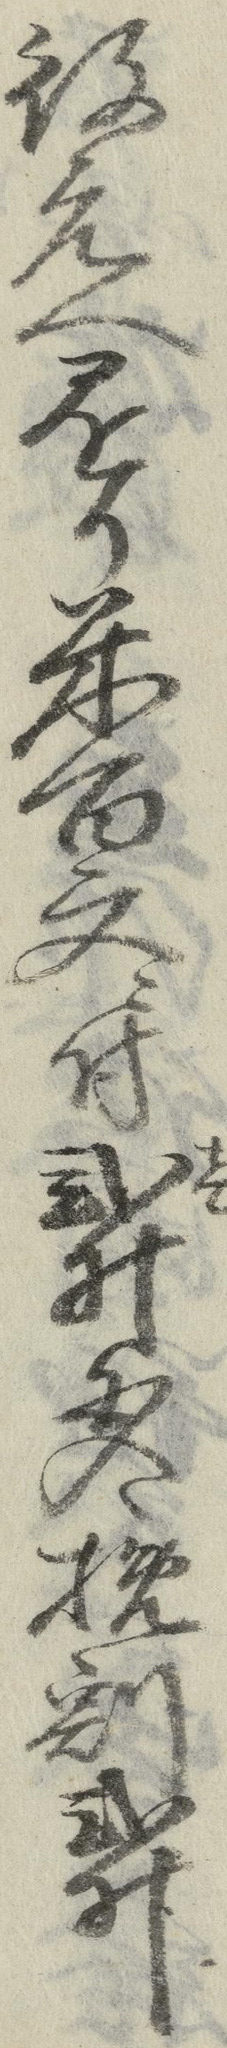役元へ懸り米百文に付弐升五合挽割弐升
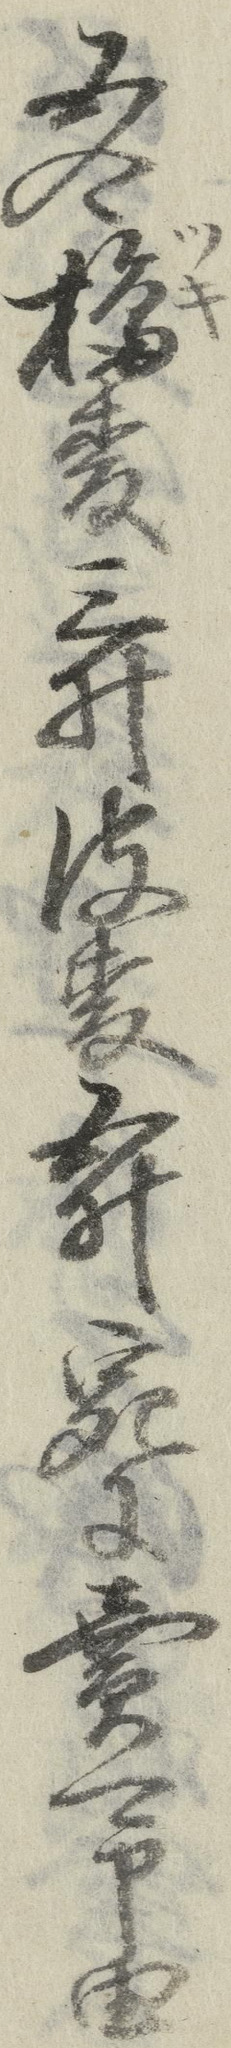五合撞麦三升皮麦五升宛に売可申由
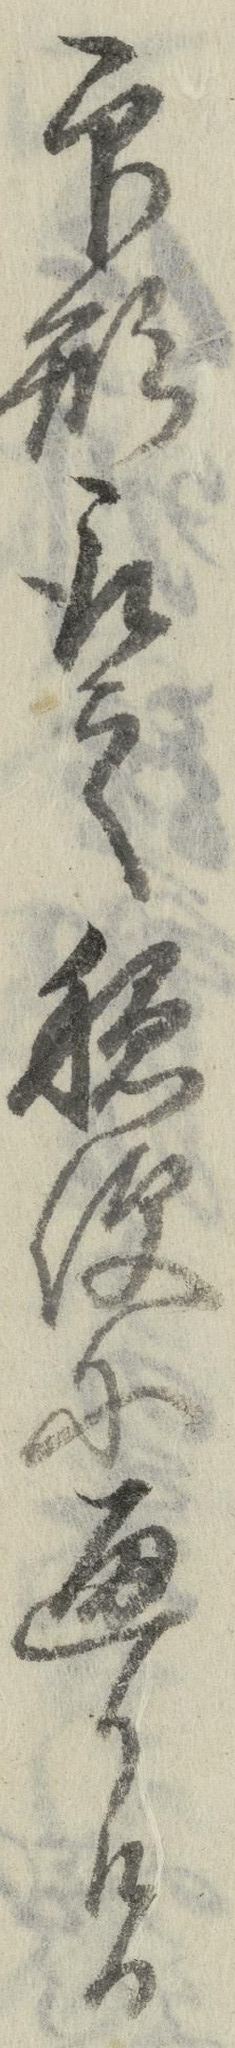印形取て穏便に通りける

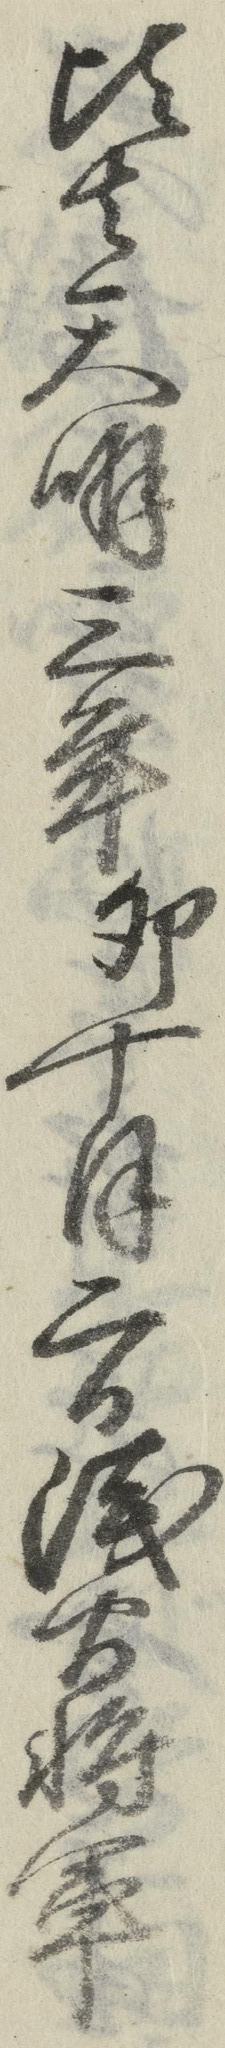頃は天明三年卯十月二日浅間将軍
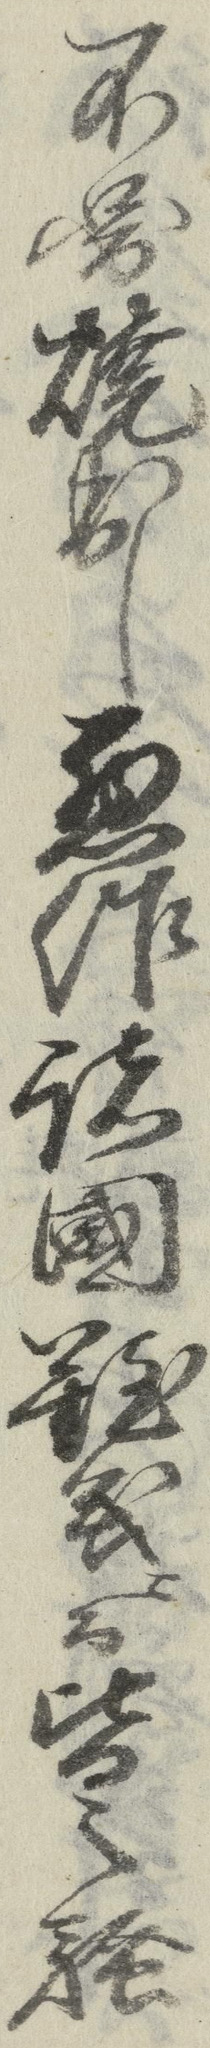不図焼出し悪作諸国難義に而皆々騒
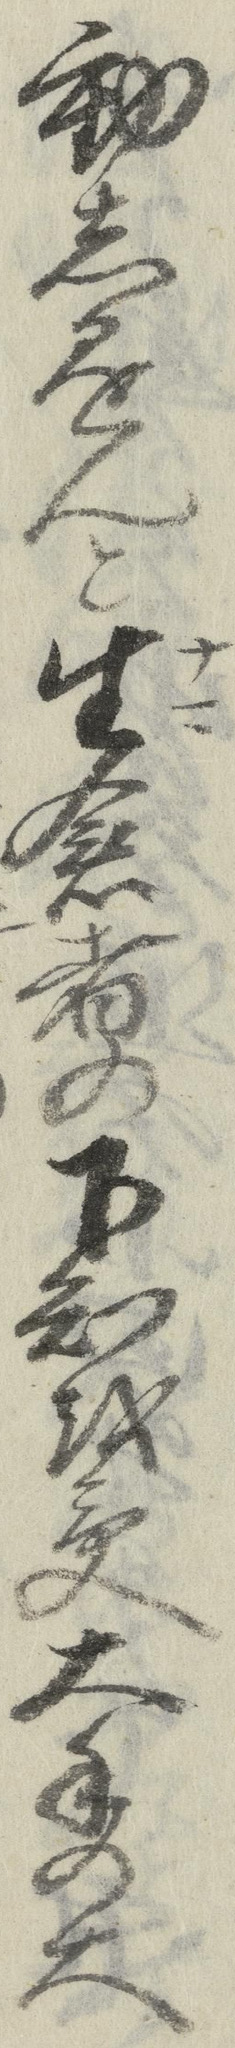動し懸んと生倉者の下知を受大手の大
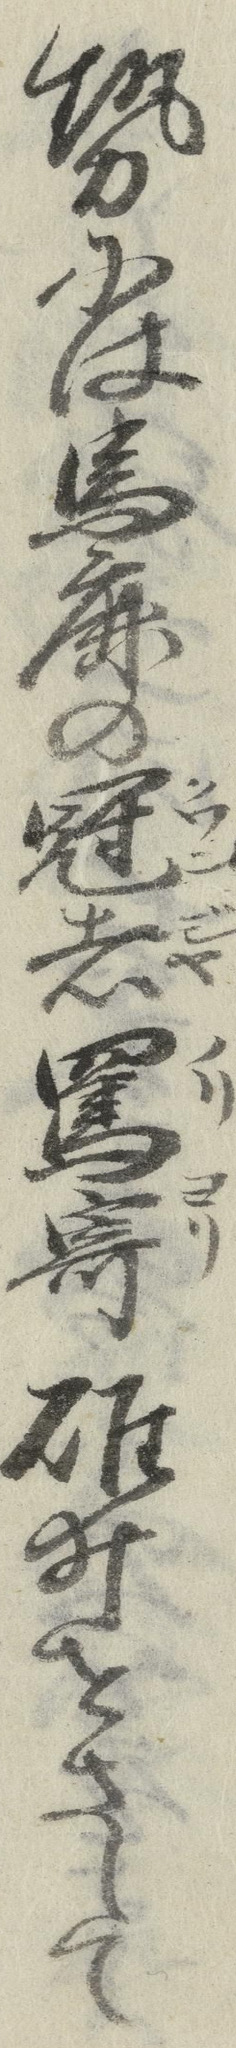勢には馬鹿の冠者罵寄碓井をさして
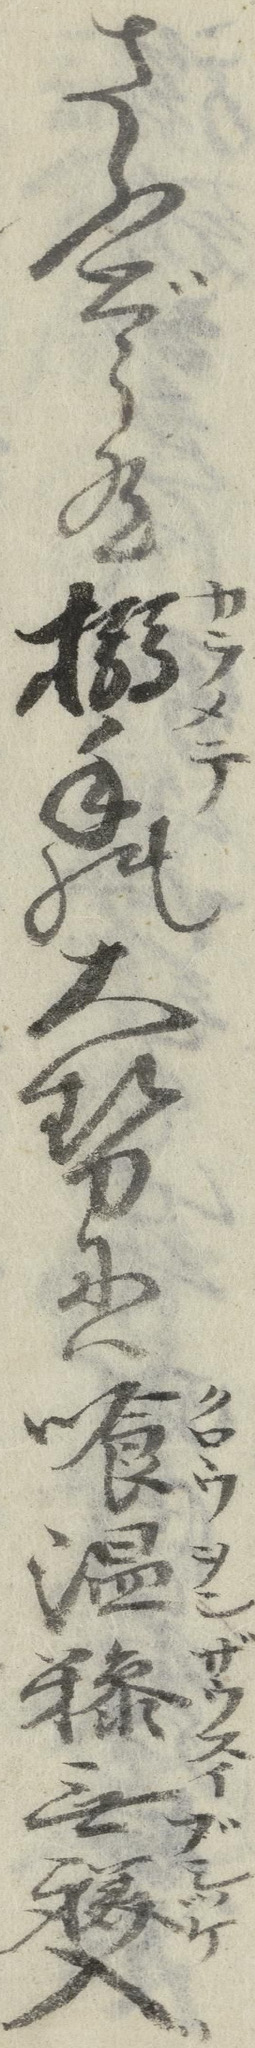さふどう有搦手の大勢には喰温糝無躾入
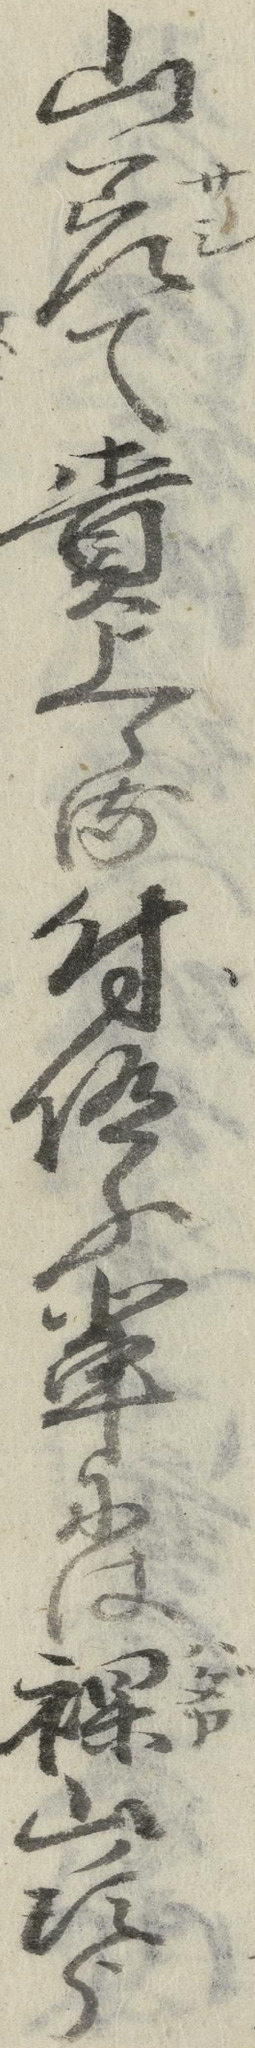山差て貴上らる付随ふ輩には裸山ノ頂ら
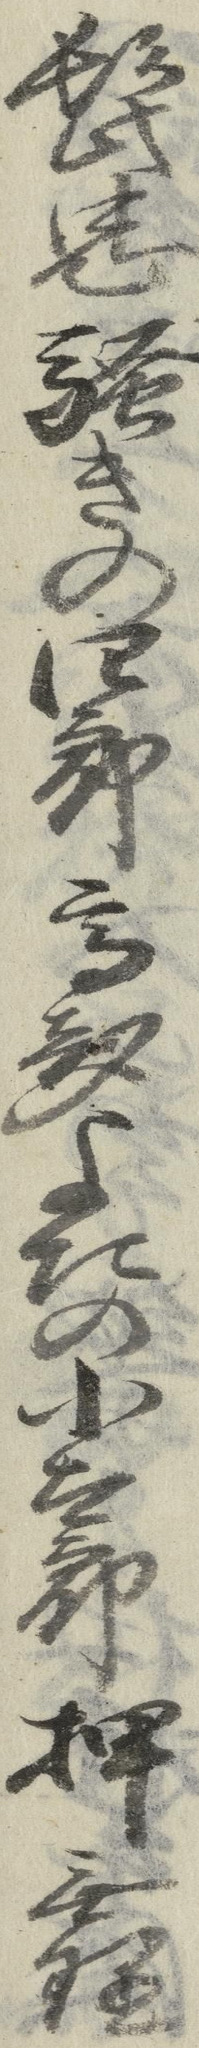髭鬼-騒きの四郎高勢よたの小太郎押無理
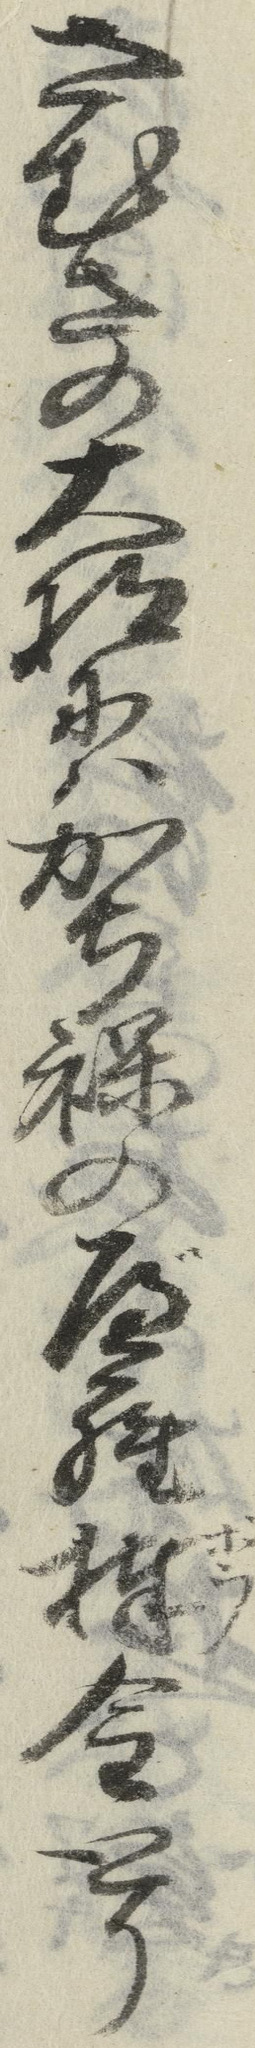さむさの大将にはかち裸のべ羅棒金とり
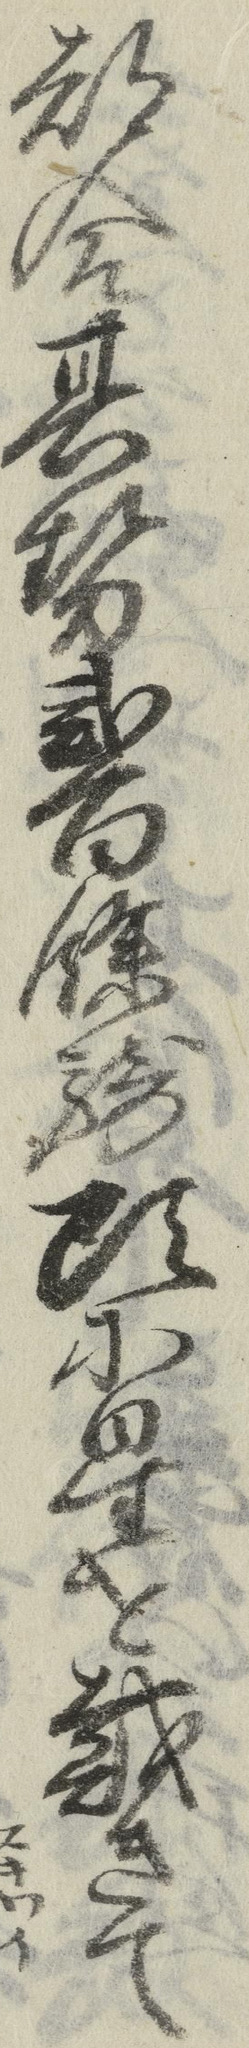都合其勢弐百餘騎頭等星を戴きて
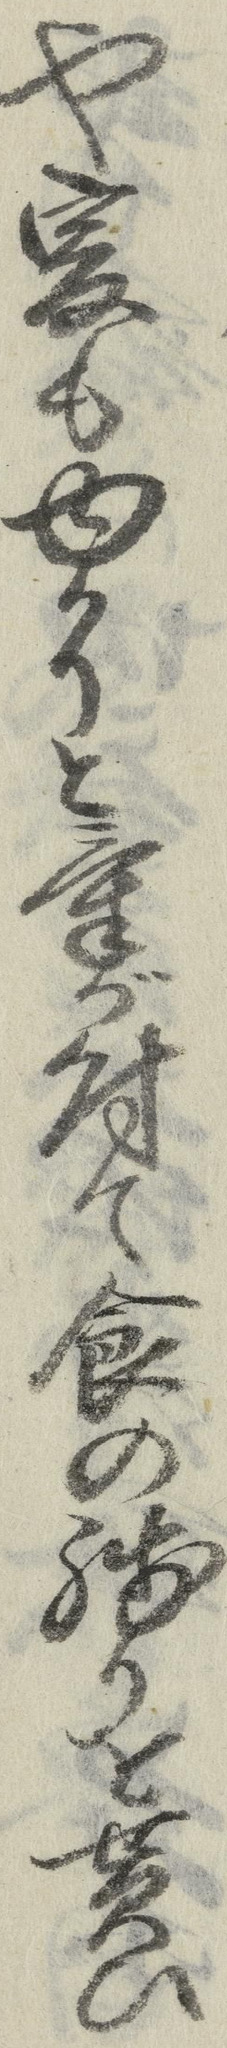や爰もゆかりと気が付て食の残りを貰ひ
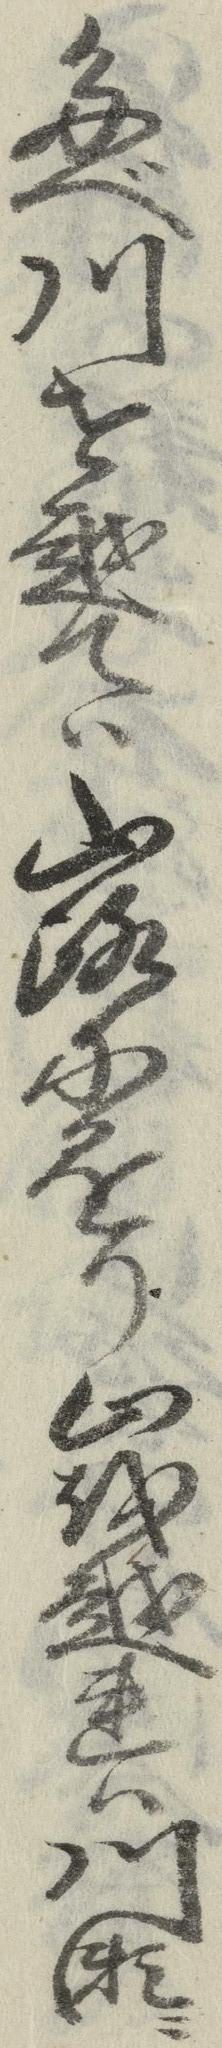たべ川を越ては山路に懸り山を越れは川瀬に
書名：浅間大焼騒動記　中
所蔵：東京大学地震研究所図書室 Earthquake Research Institute Library, The University of Tokyo, JAPAN
